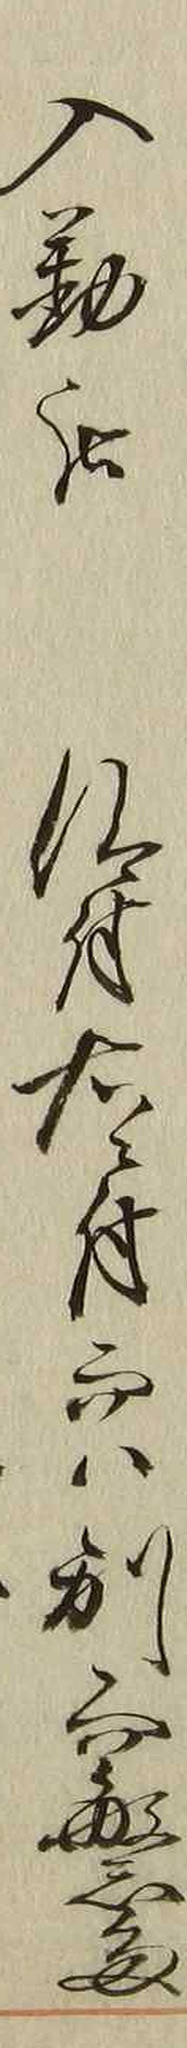入勤被仰付右ニ付而ハ別而敏繁多
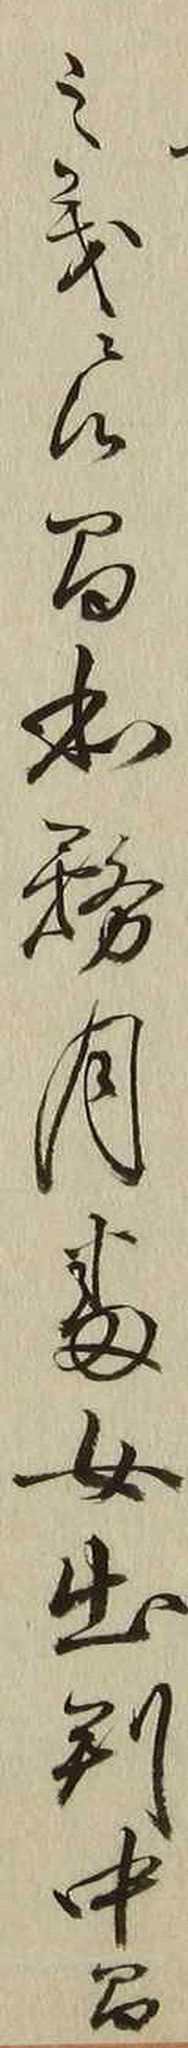之義ニ候間本務月番女出判中間
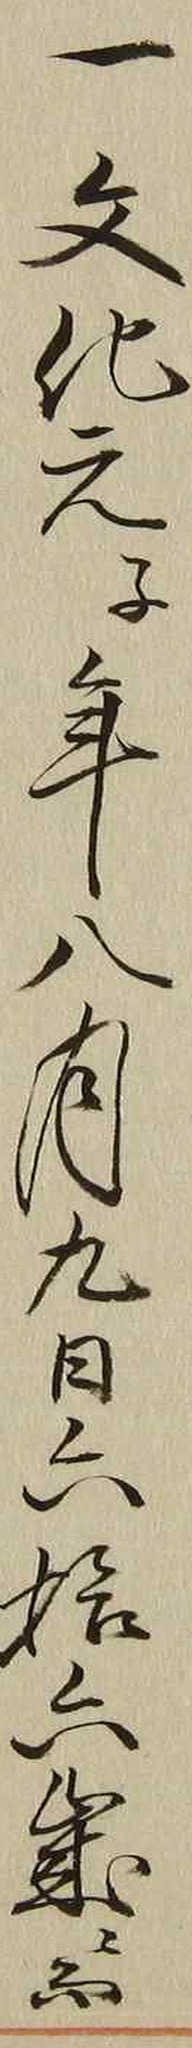一文化元子年八月九日六拾六歳ニ而
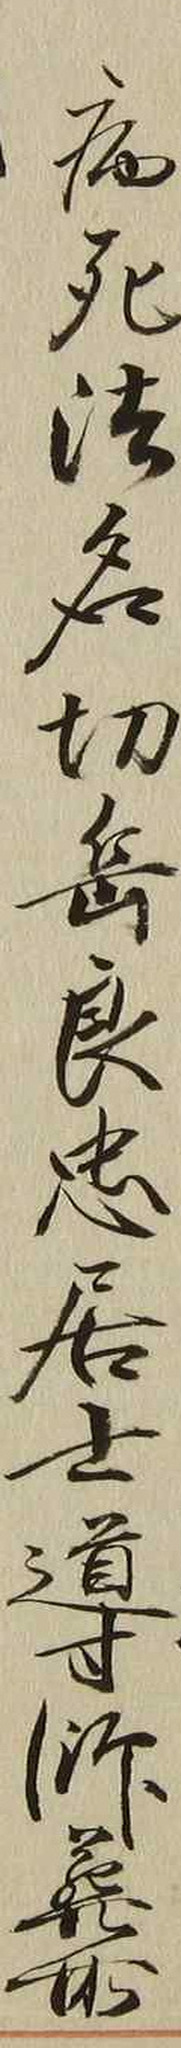病死法名切岳良忠居士導師葬所
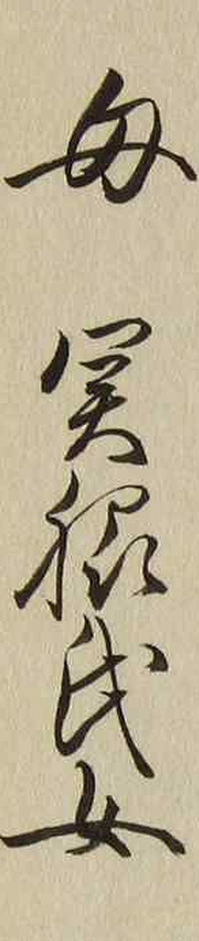母関脇氏女

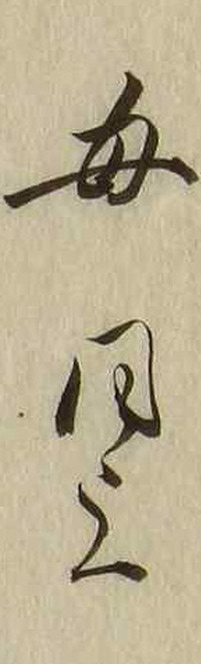母同上
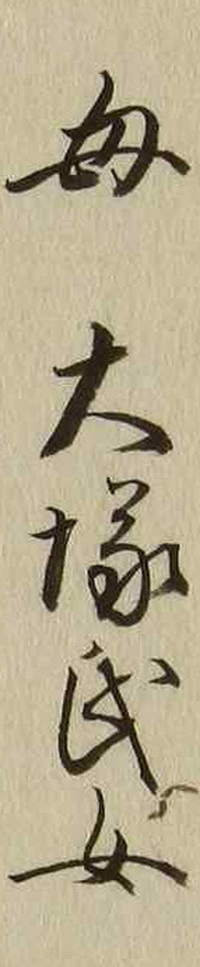母大塚氏女
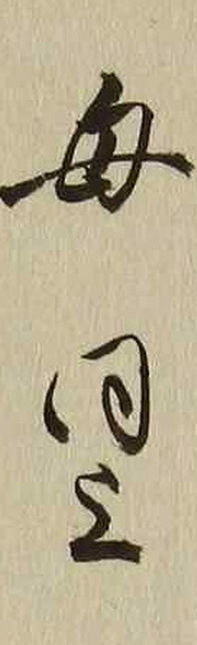母同上
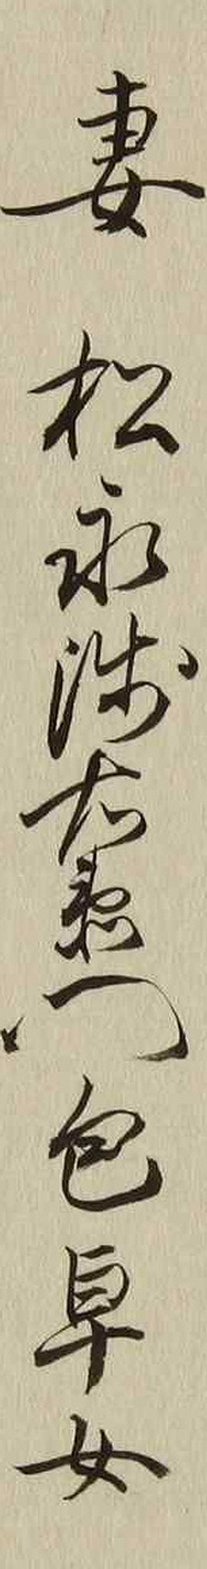妻松永浅右衛門包卓女
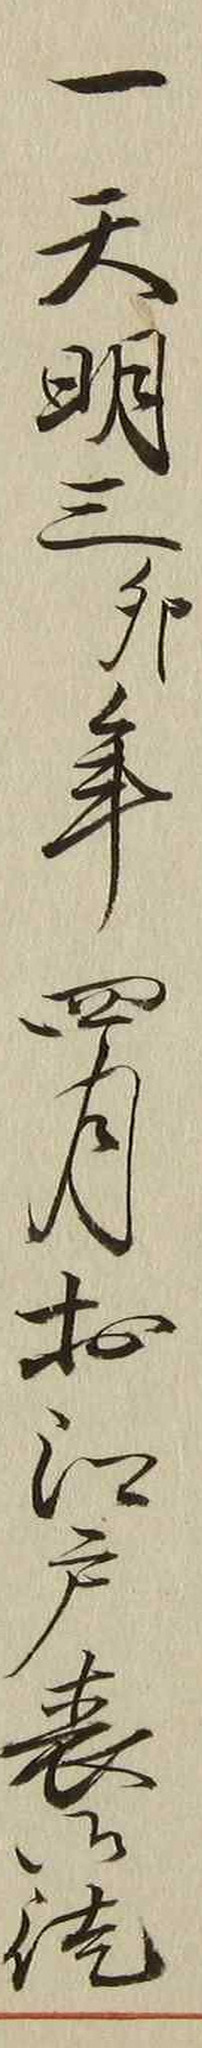一天明三卯年四月於江戸表御徒
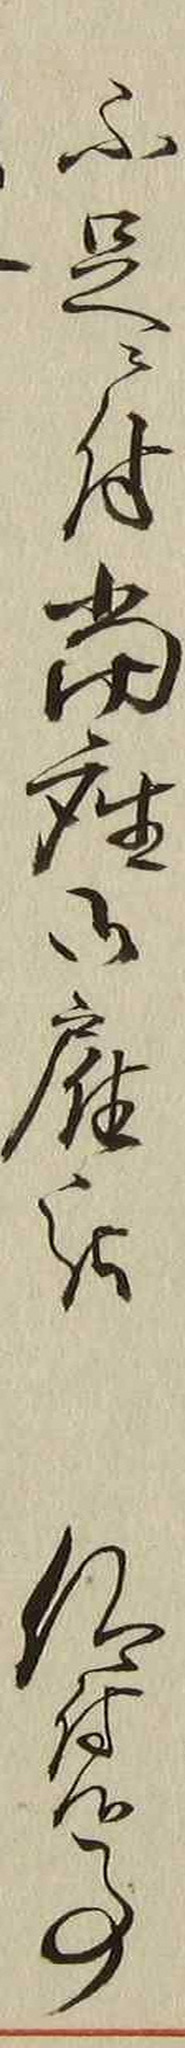不足ニ付当座御雇被仰付候事
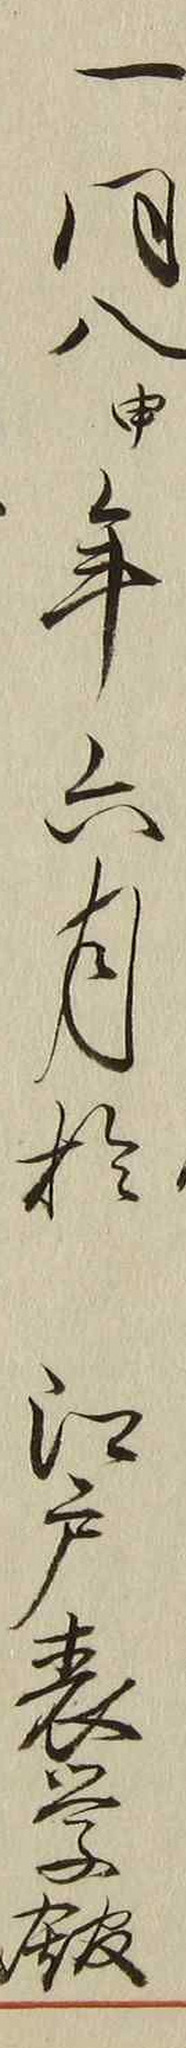一同八申年六月於江戸表学館
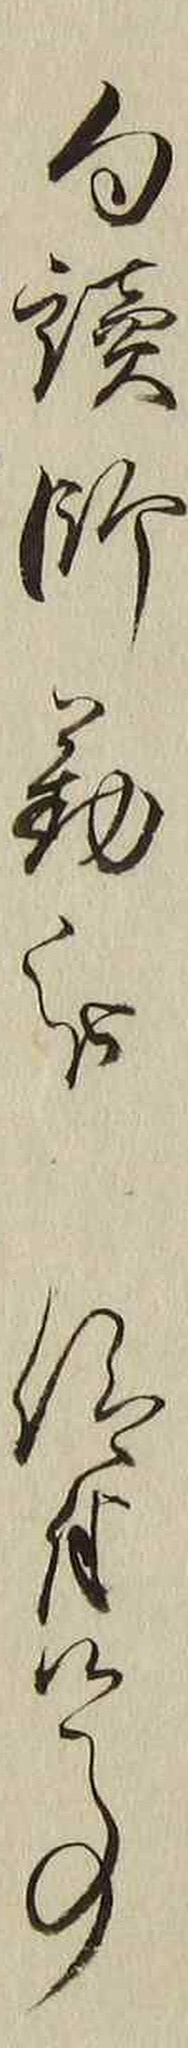句読師勤被仰付候事
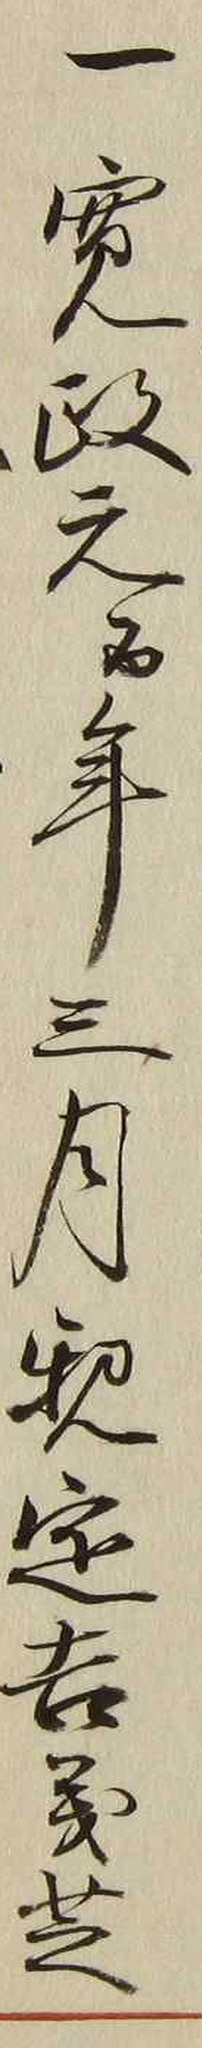一寛政元酉年三月親定吉義芝
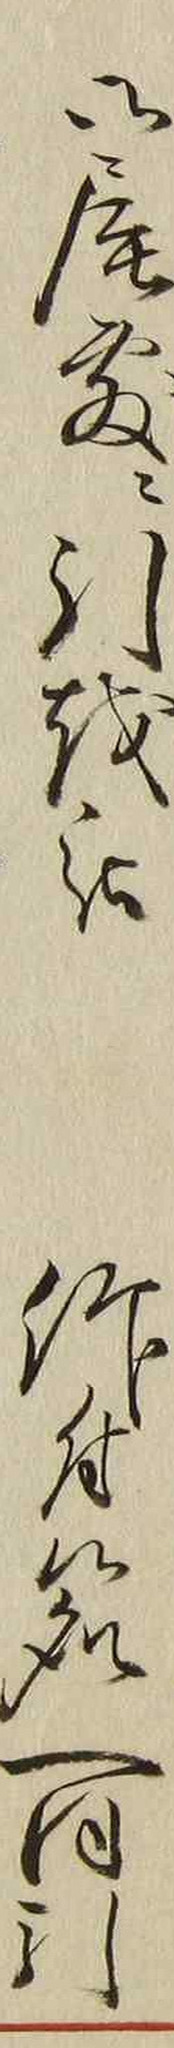御屋敷ニ引越被仰付候処一同引
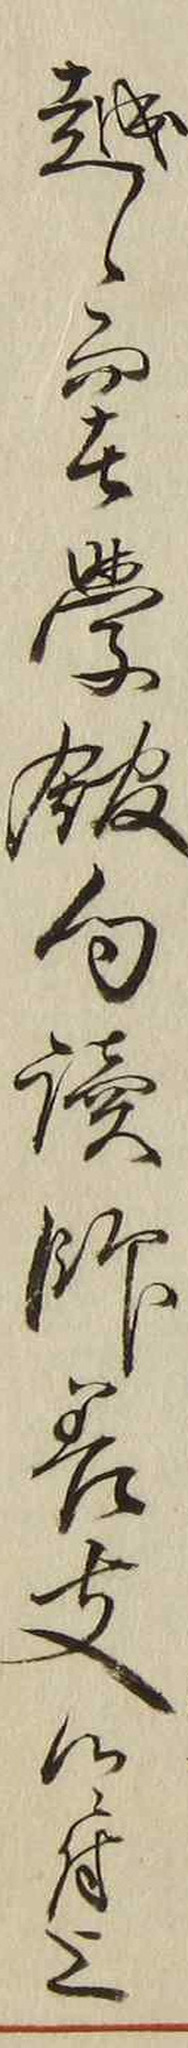越候而者学館句読師差支候ニ付上
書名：諸士系譜　巻之57　ほ之部4
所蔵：会津若松市立会津図書館
